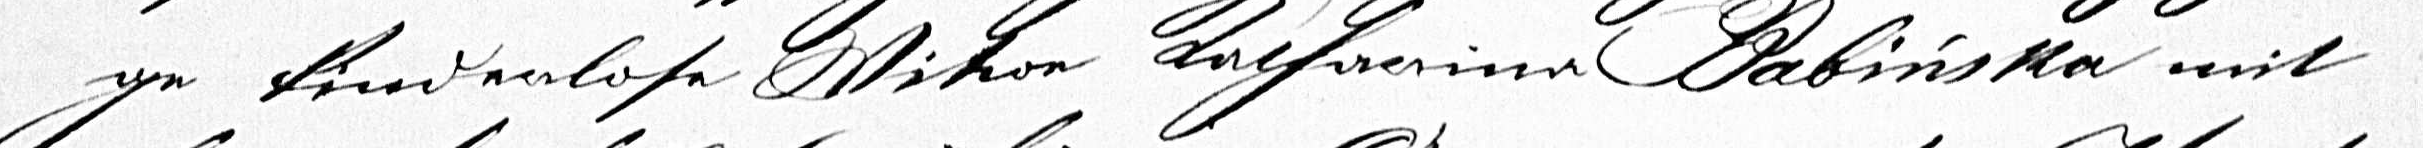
ge kinderlose Witwe Katharina Babińska mit
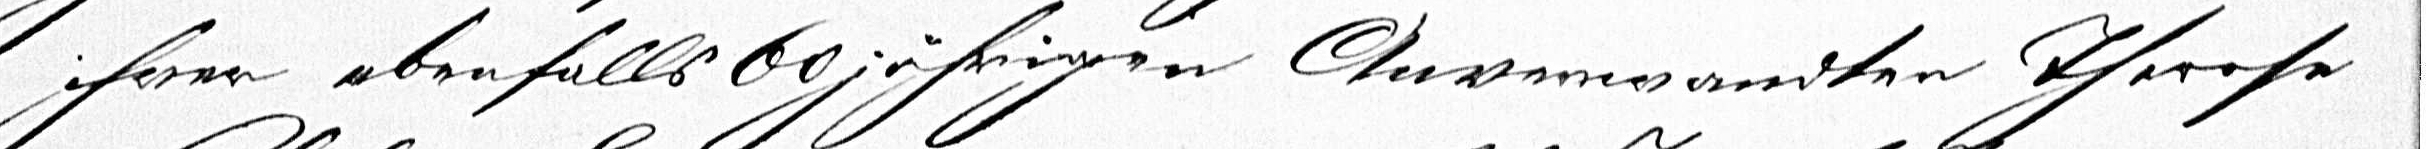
ihrer ebenfalls 60jährigen Anverwandten Therese
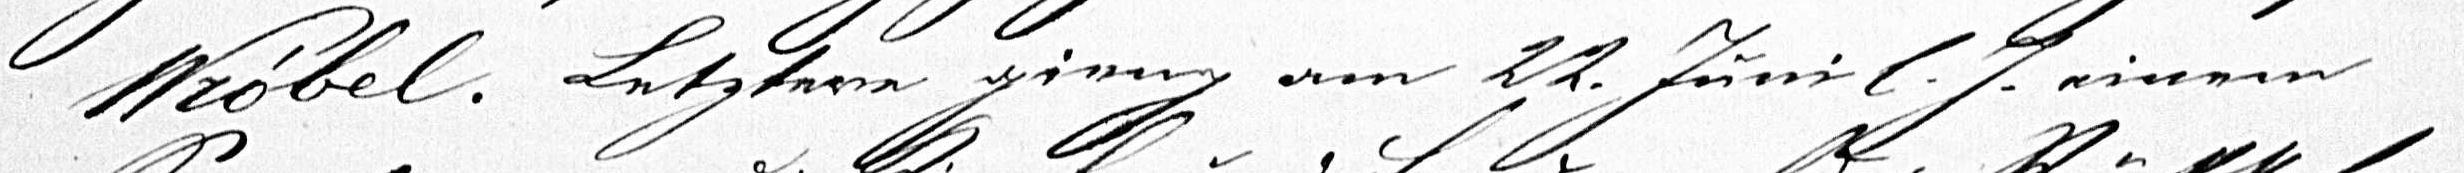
Wróbel. Letztere gieng am 22. Juni l. J. einem
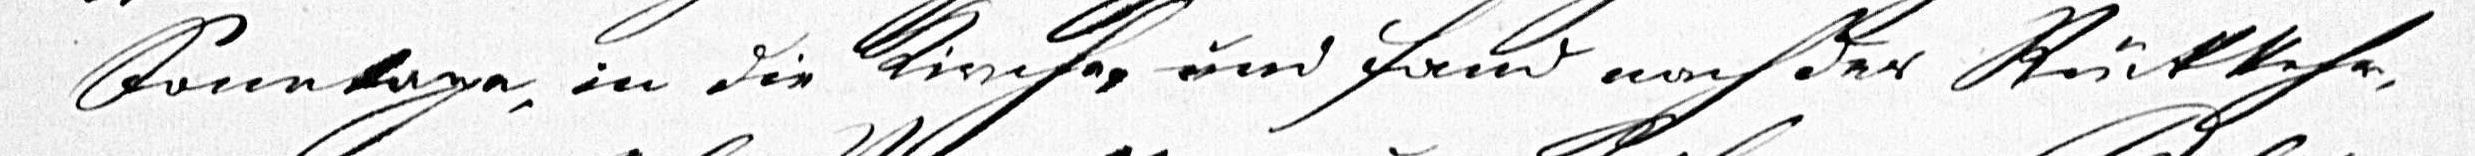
Sonntage, in die Kirche und Fand nach der Rückkehr,
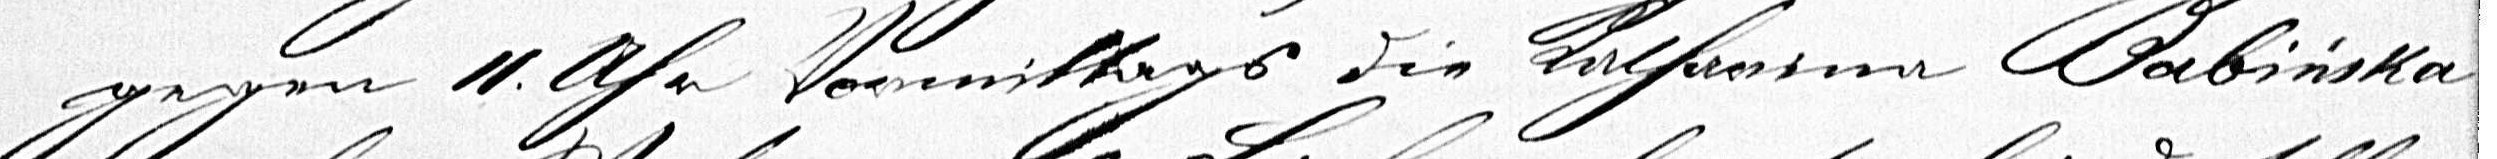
gegen 11. Uhr Vormittags die Katharina Babińska
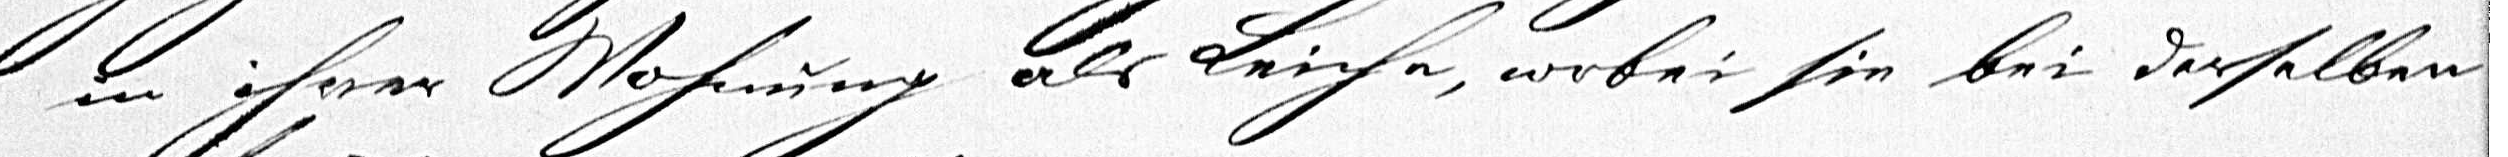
in ihrer Wohnung als Leiche, wobei sie bei derselben
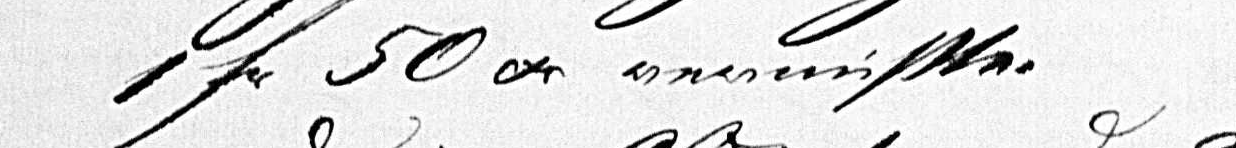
1 fr 50 xx vermißte.
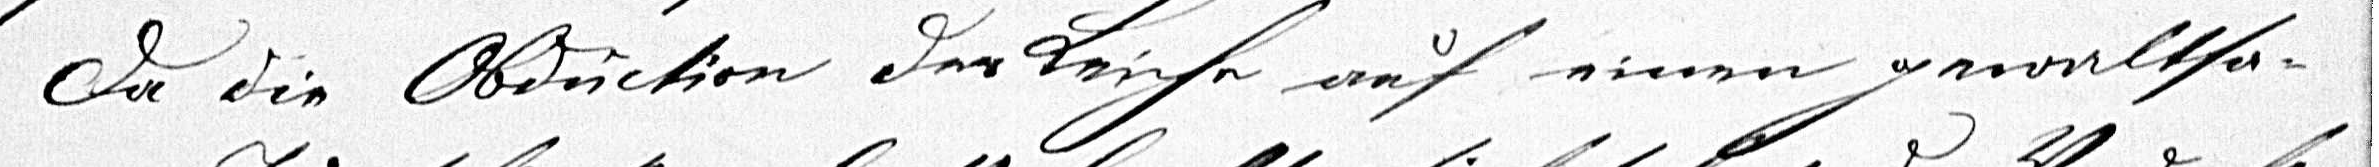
Da die Obduction der Leiche auf einen gewaltsa¬
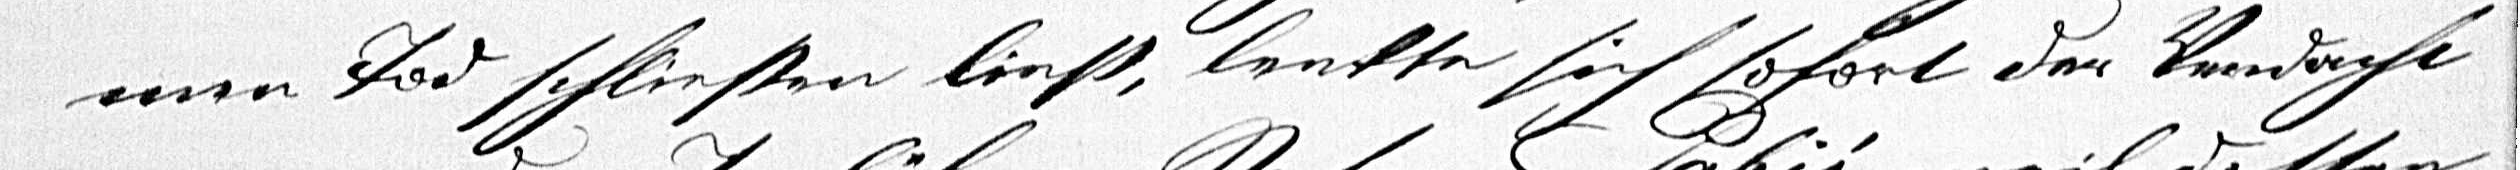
men Tod schließen ließ, lenkte sich sofort der Verdacht
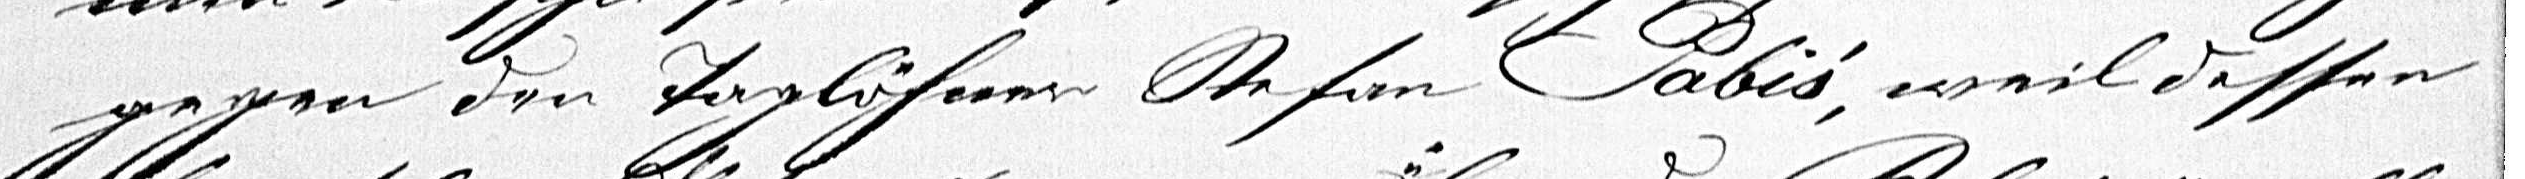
gegen den Taglöhner Stefan Pabiś, weil dessen
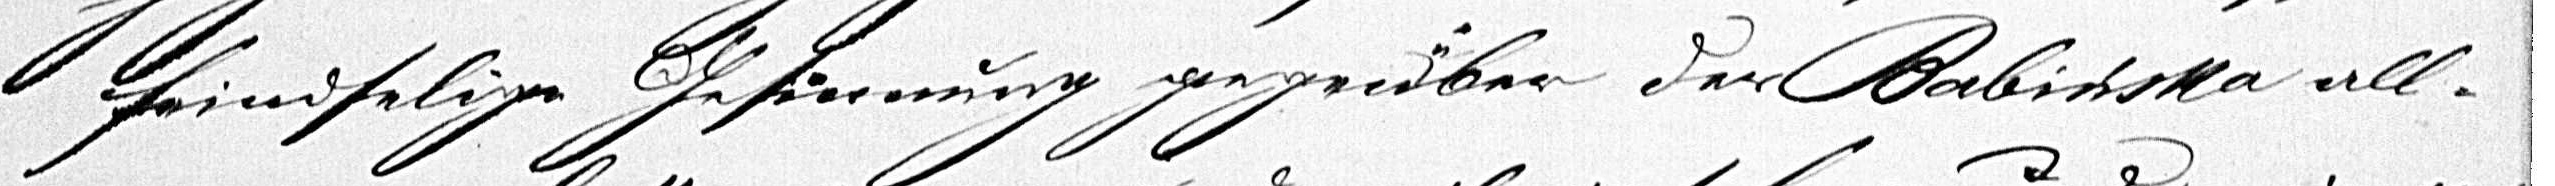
feindselige Gesinnung gegenüber der Babińska all¬
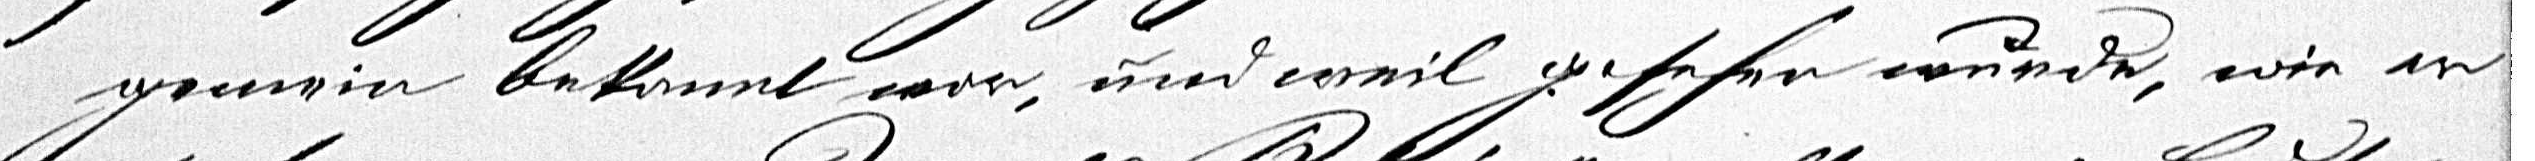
gemein bekannt war, und weil gesehen wurde, wie er
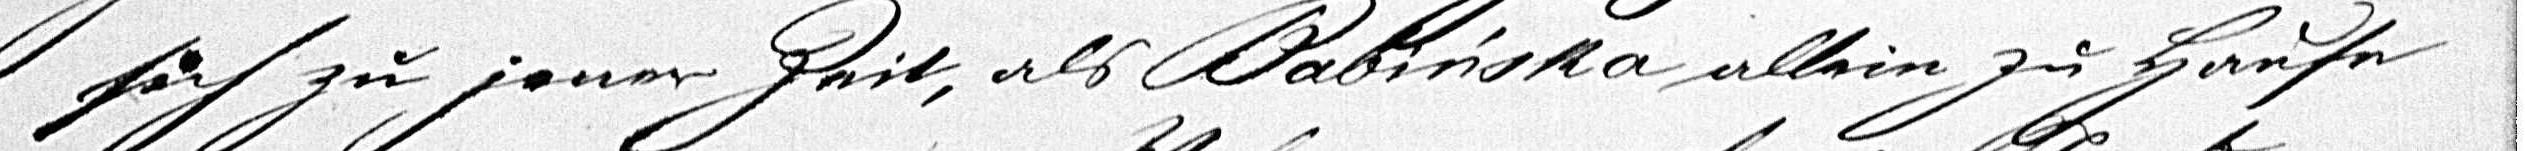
sich zu jener Zeit, als Babińska allein zu Hause
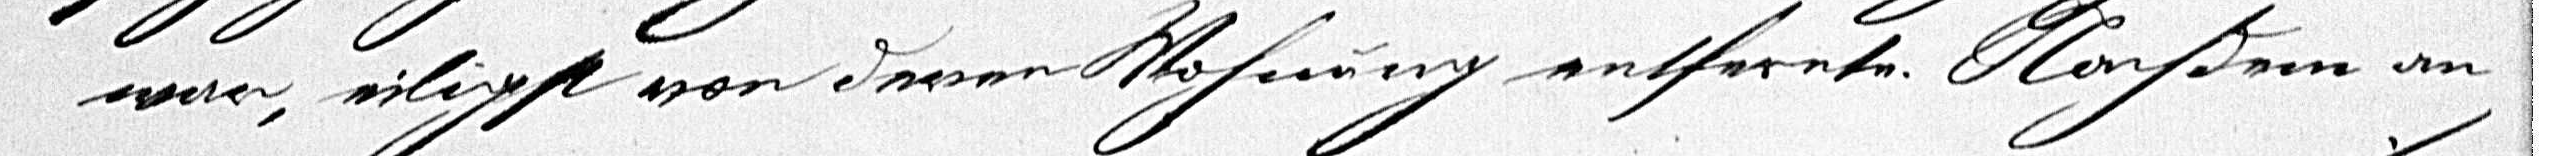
war, eiligst von deren Wohnung entfernte. Nachdem an
